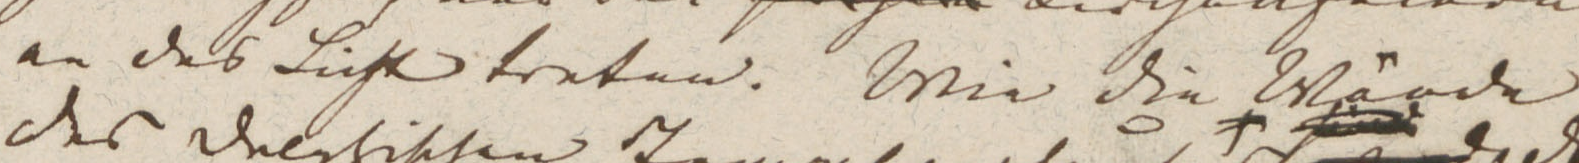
an das Licht treten. Wie die Wände
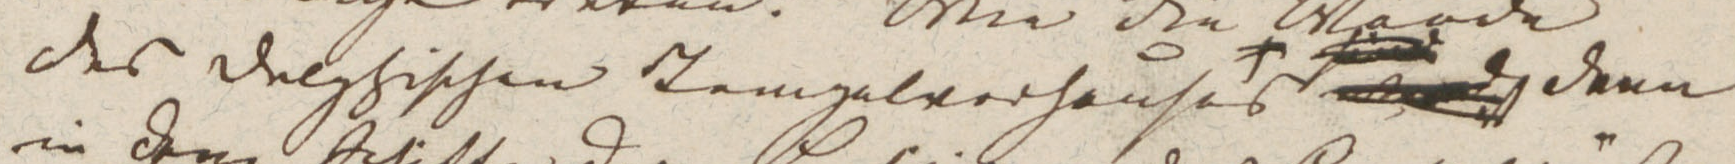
des Delphischen Tempelvorhauses sind % dann
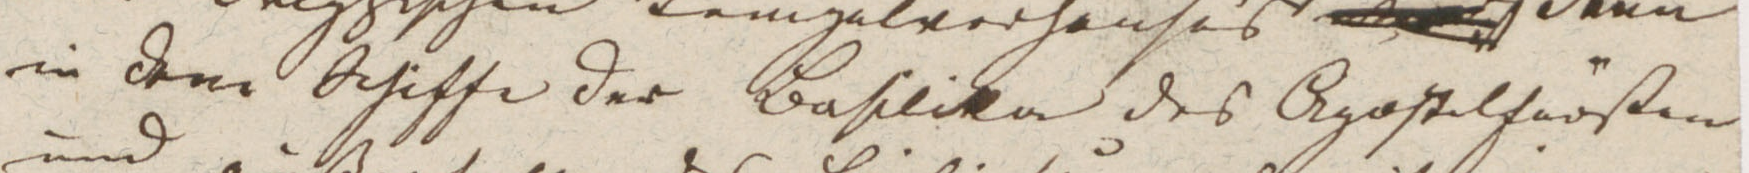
in dem Schiffe der Basilika des Apostelfürsten
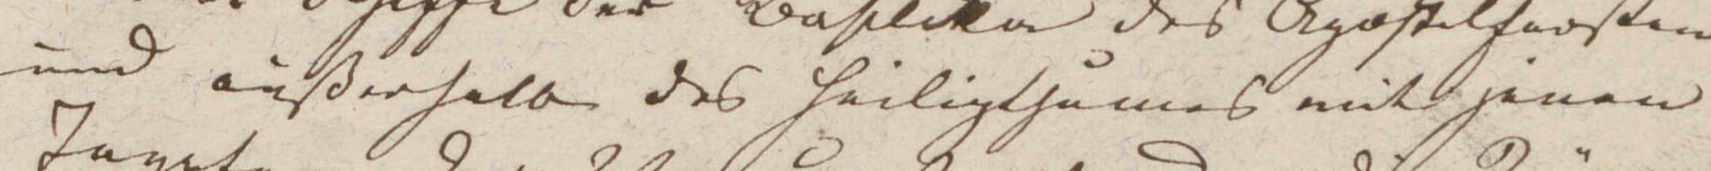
und ausserhalb des Heiligthumes mit jenen
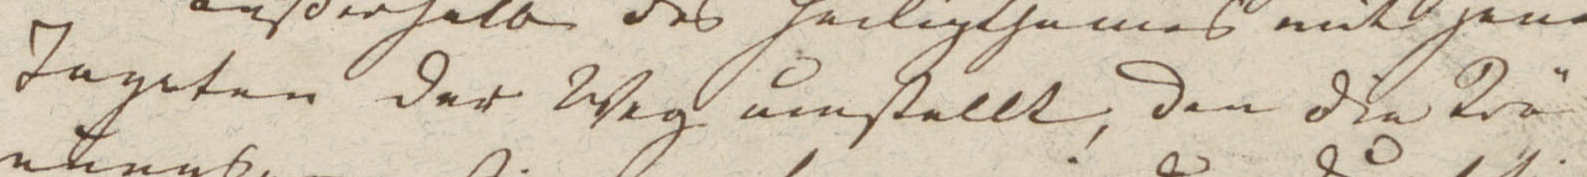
Tapeten der Weg umstellt, den die Krö-
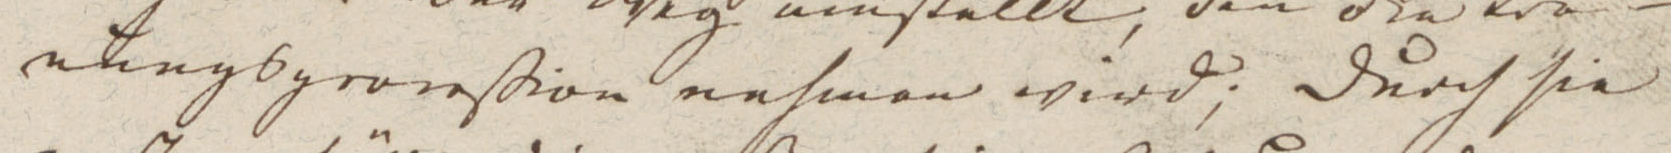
nungsprocession nehmen wird; Durch sie
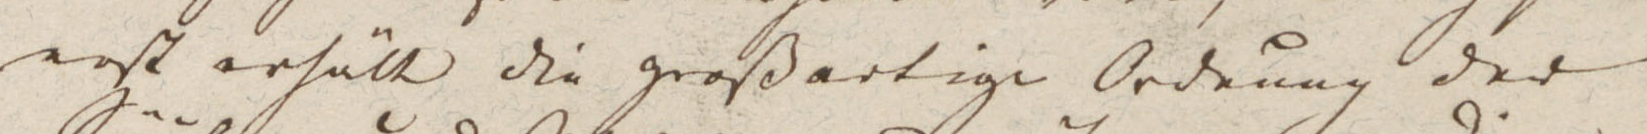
erst erhält die grossartige Ordnung der
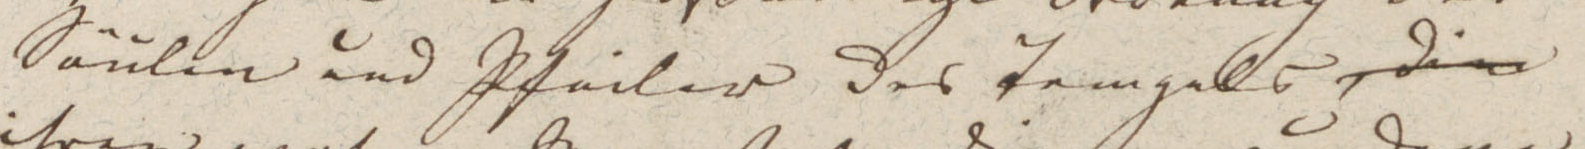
Säulen und Pfeiler des Tempels, die
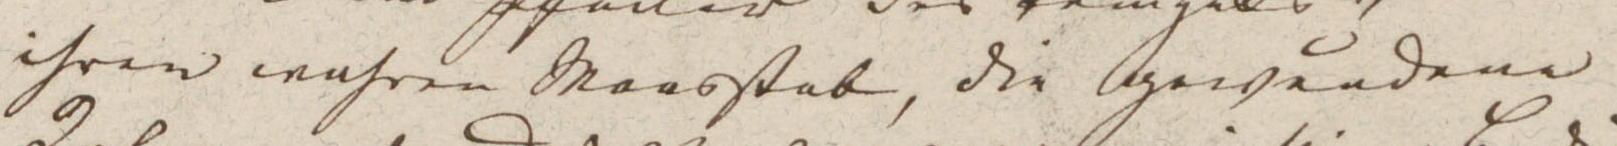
ihren wahren Maasstab, die gewundene
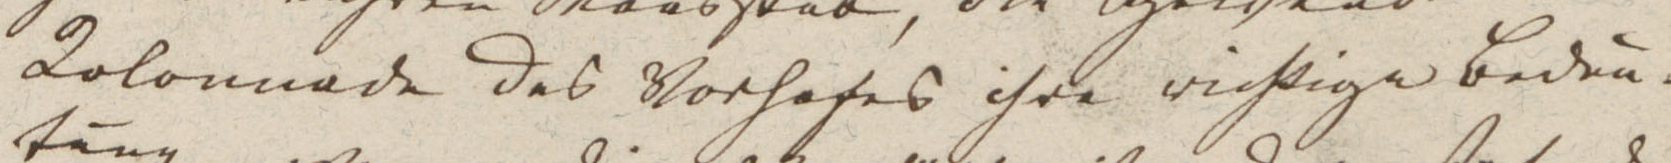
Kolonnade des Vorhofes ihre richtige Bedeu-
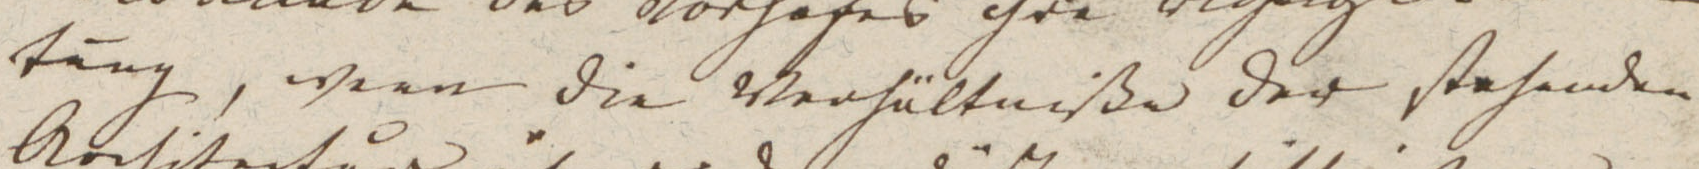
tung, wenn die Verhältnisse der stehenden
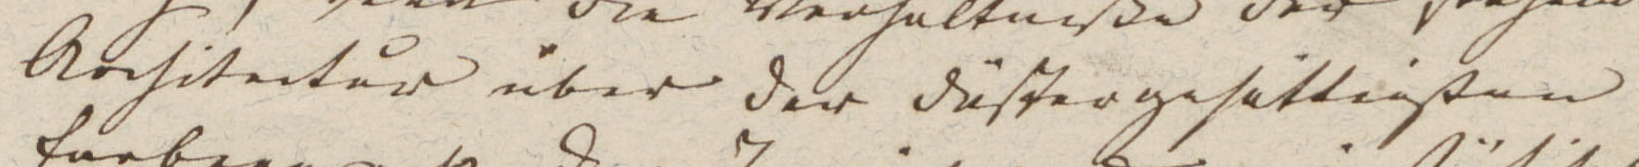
Architectur über der düstergesättigten
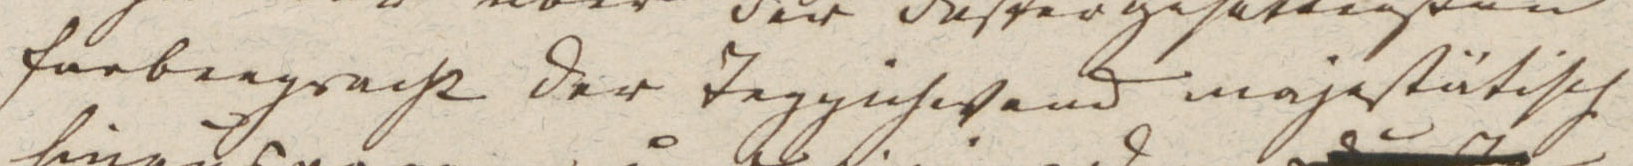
Farbenpracht der Teppichwand majestätisch
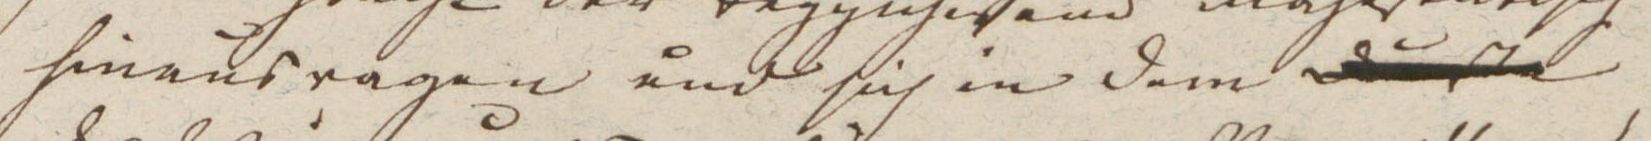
hinausragen und sich in dem Dunste
